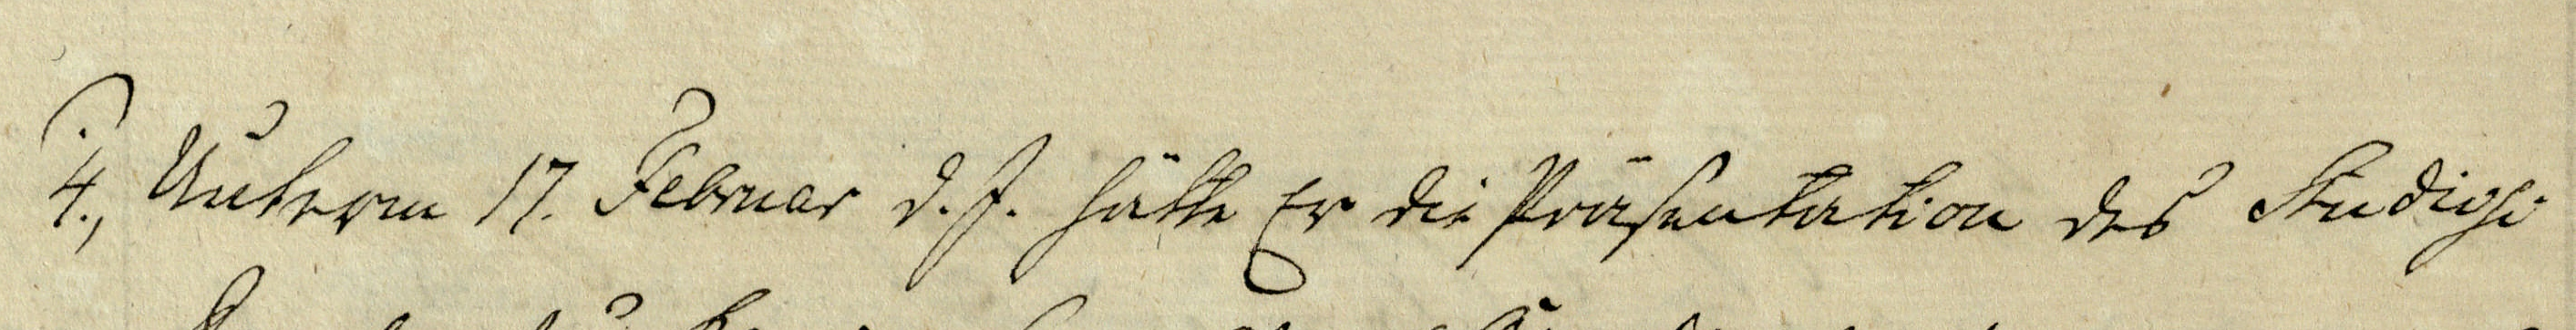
4., Unterm 17. Februar d. J. hätte Er der Präsentation des Studiosi
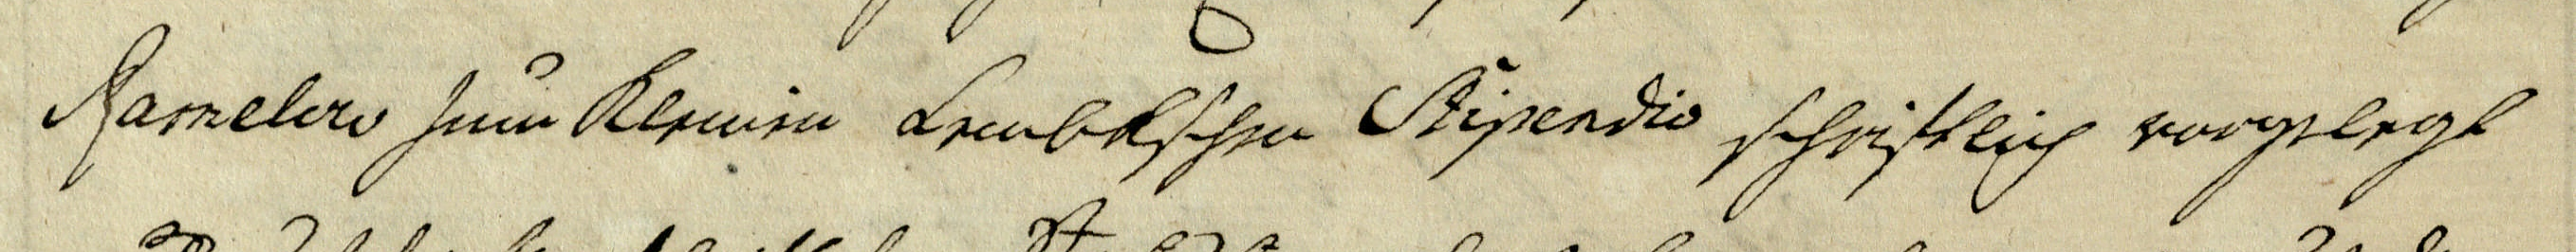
Ramelow zum kleinen Lembkschen Stipendio schriftlich vorgelegt
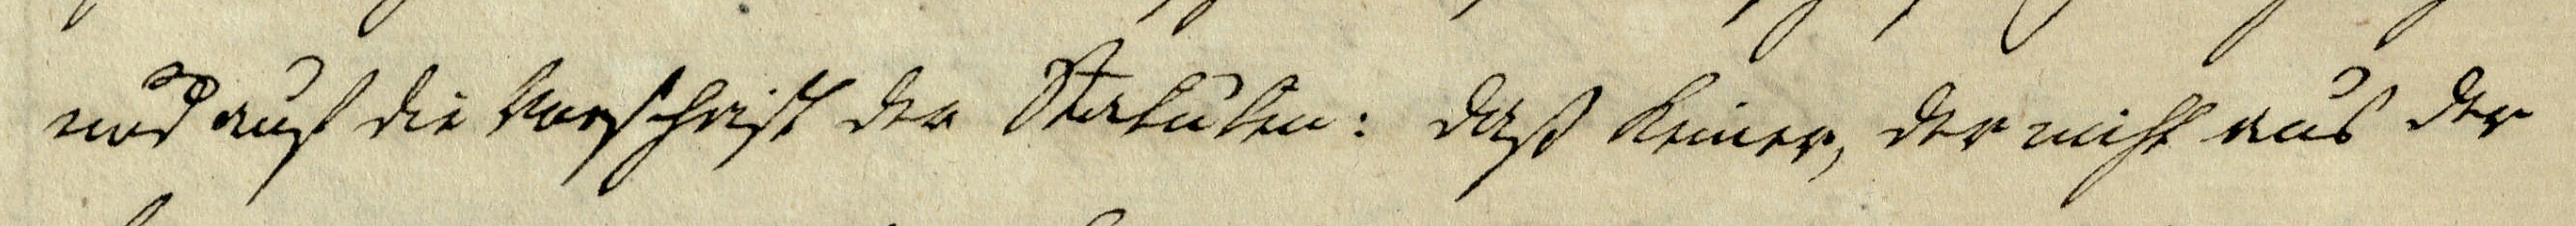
und auf die Vorschrift der Statuten: daß keiner, der nicht aus der
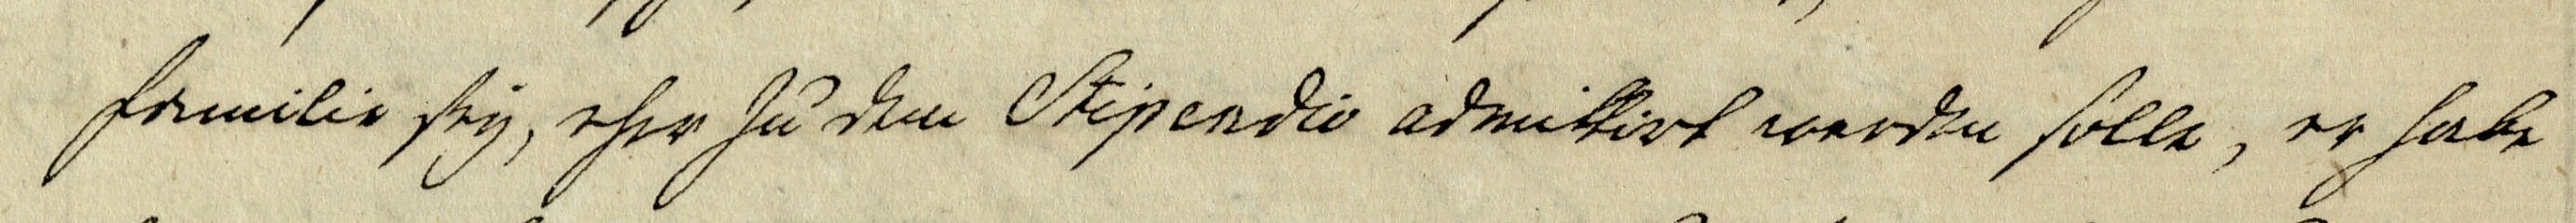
Familie seÿ, eher zu dem Stipendio admittirt werden solle, er habe
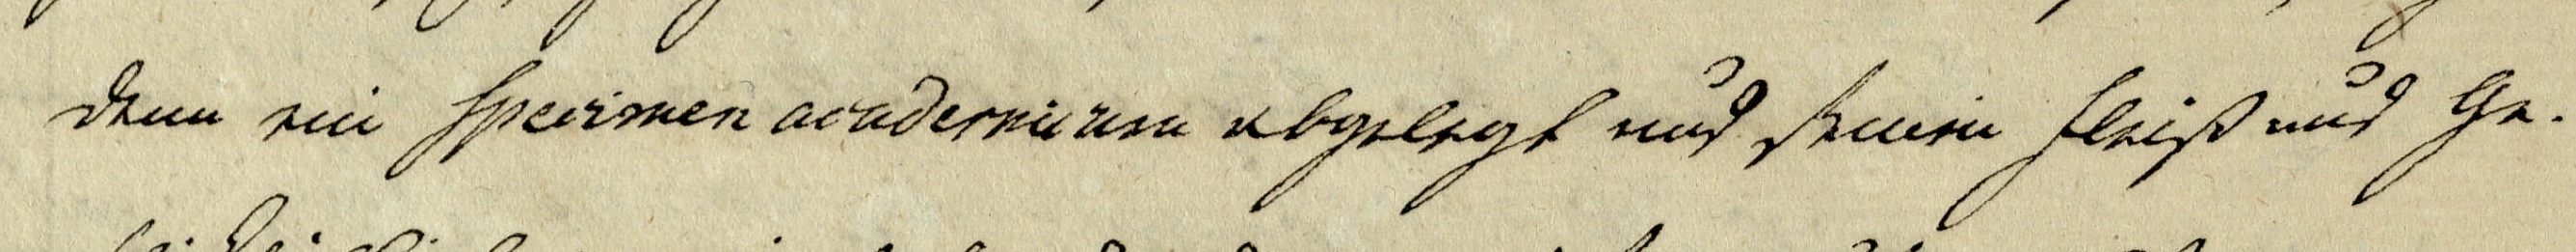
denn ein Specimen academicum abgelegt und seinen Fleiß und Ge¬
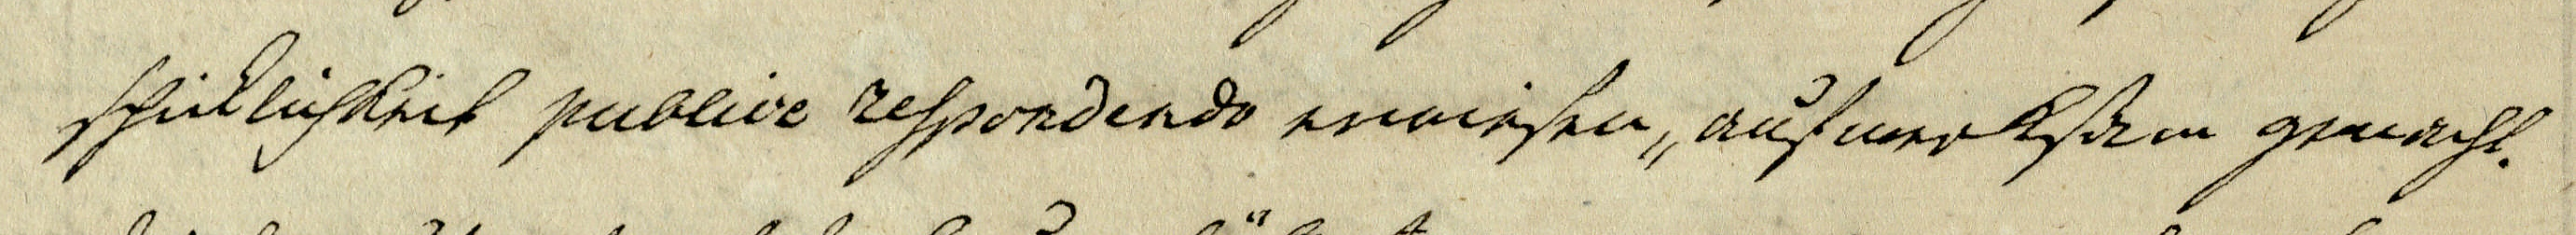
schicklichkeit publice respondendo erwiesen, aufmerksam gemacht.
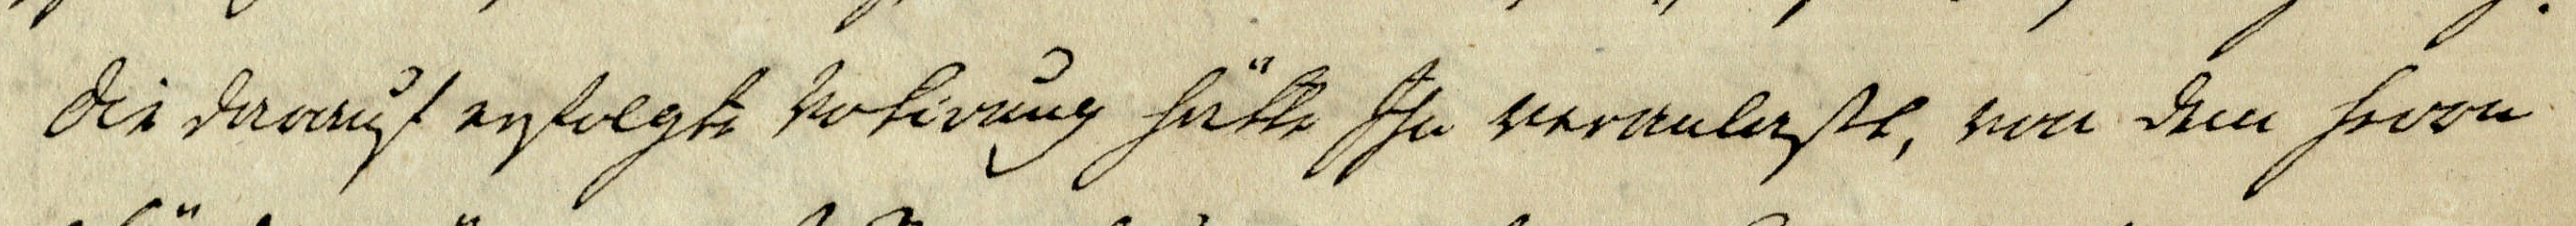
Die darauf erfolgte Votirung hätte Ihn veranlaßt, von dem Herrn
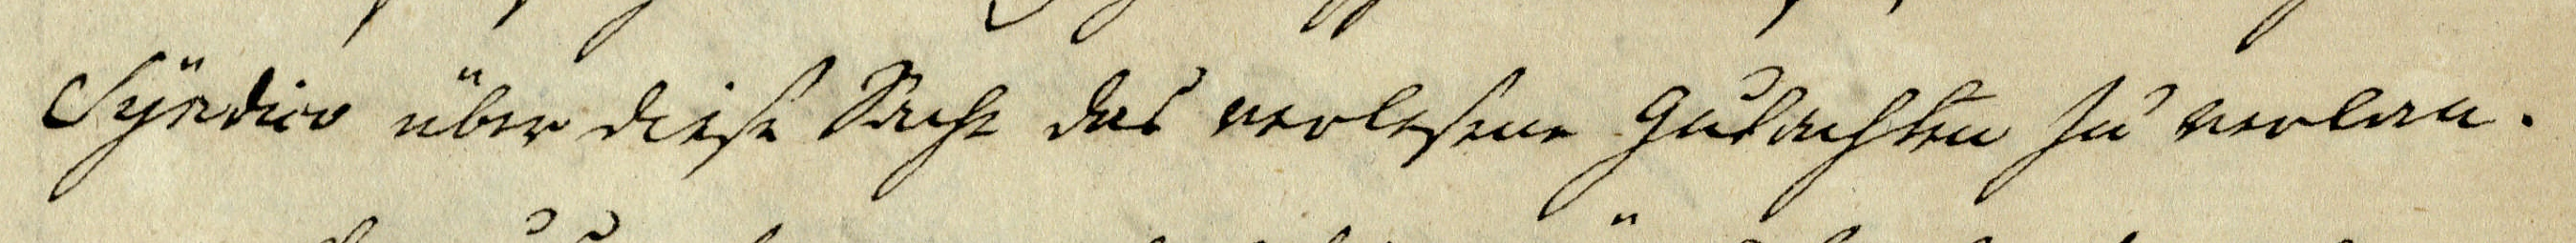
Sÿndico über diese Sache das verlesene Gutachten zu verlan¬
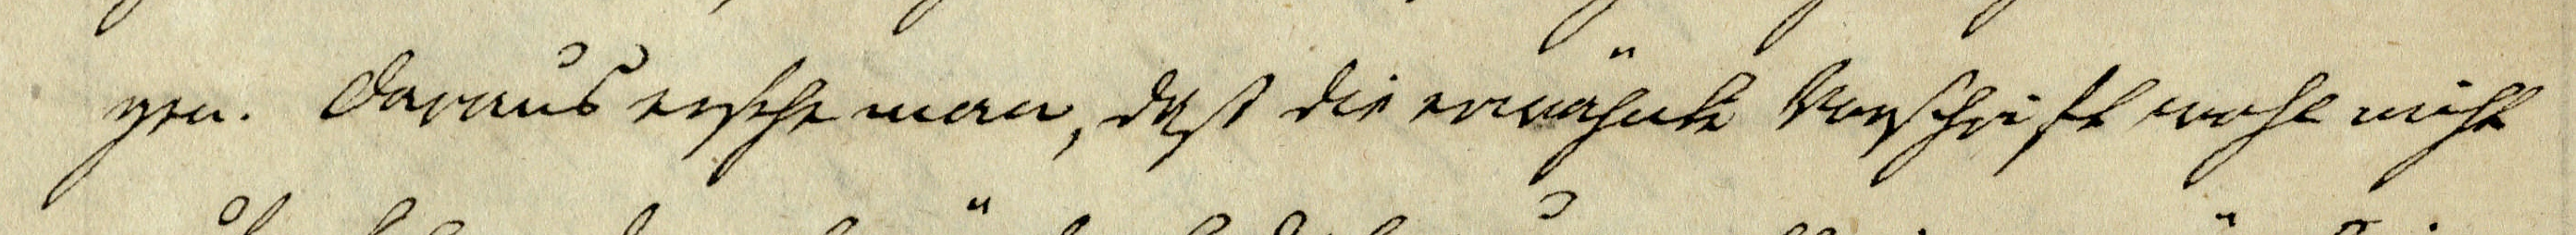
gen. Daraus ersehe man, daß die erwähnte Vorschrift wohl nicht
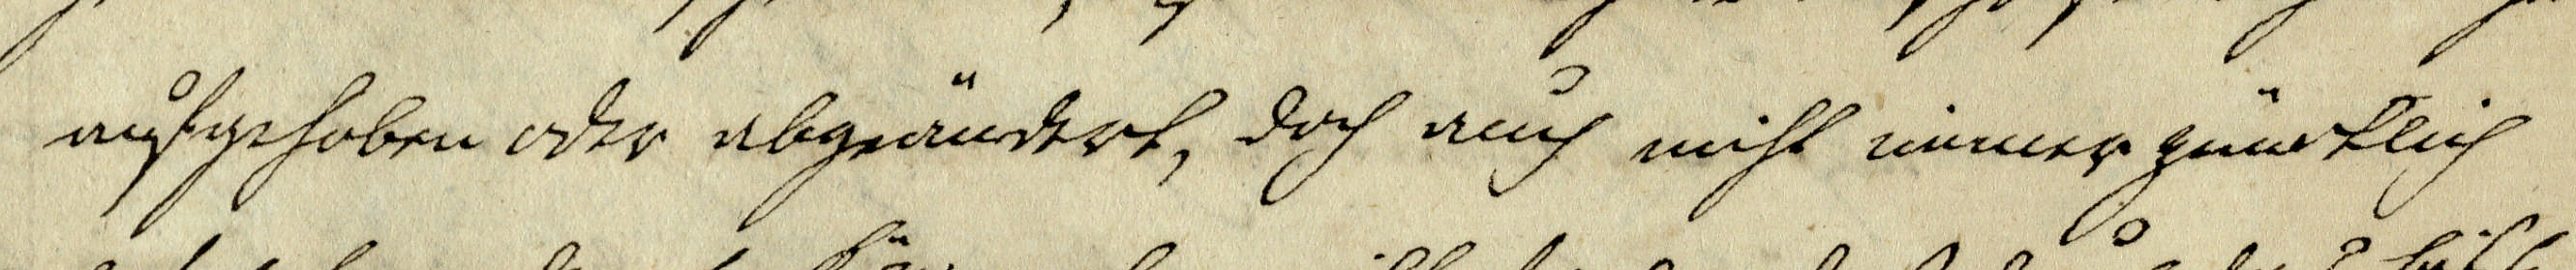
aufgehoben oder abgeändert, doch auch nicht immer pünktlich
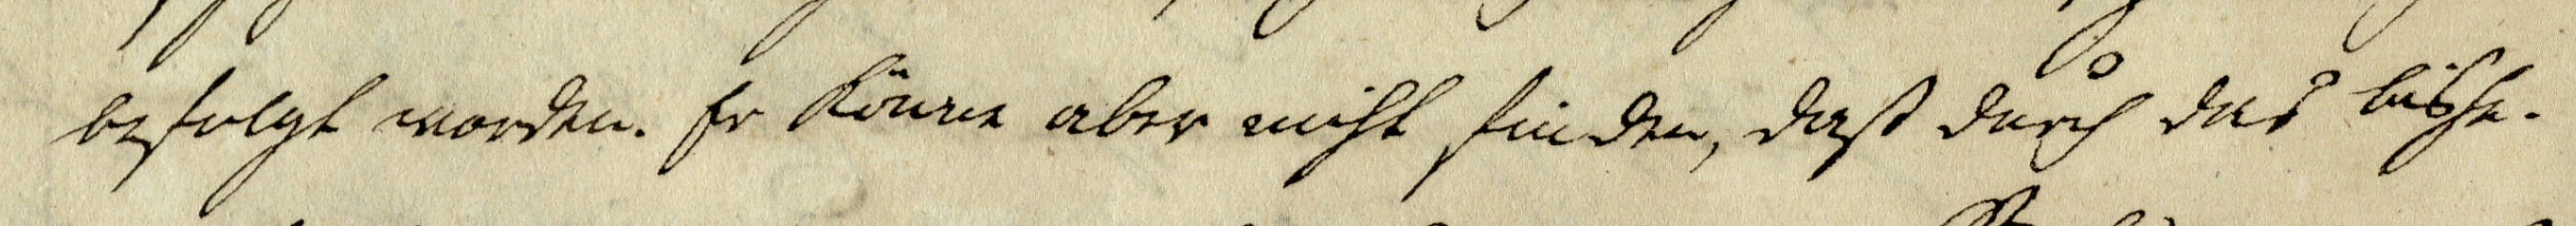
befolgt worden. Er könne aber nicht finden, daß durch das bishe¬
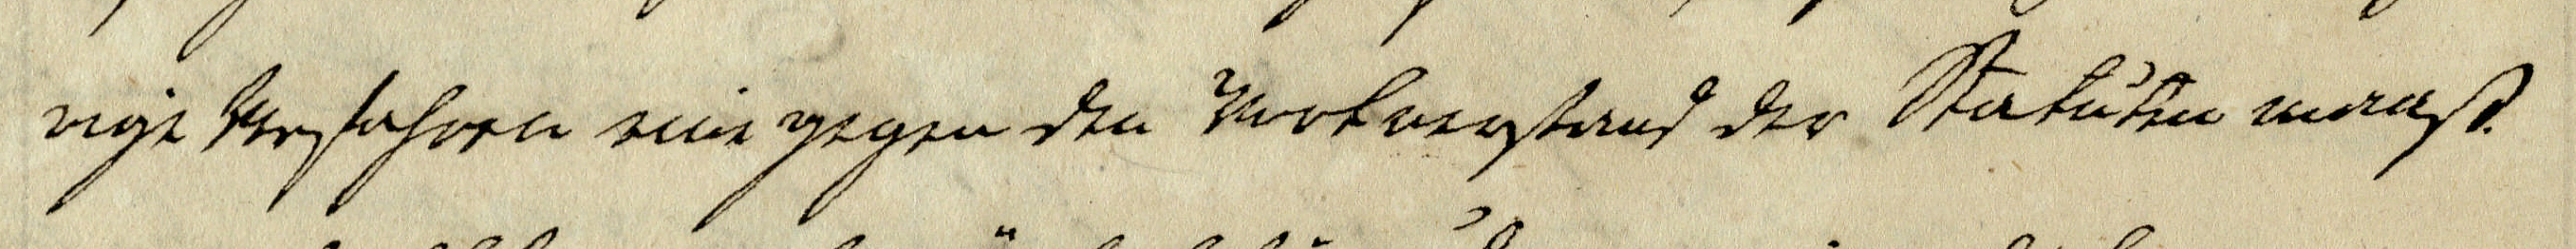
rige Verfahren eine gegen den Wortverstand der Statuten maaß¬
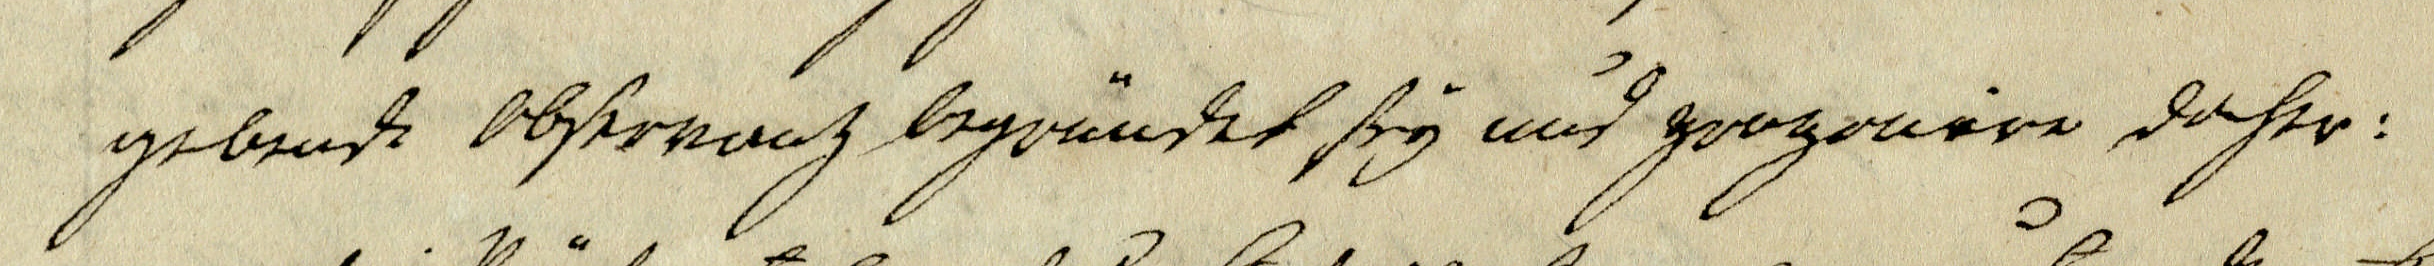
gebende Observanz begründet seÿ und proponire daher:
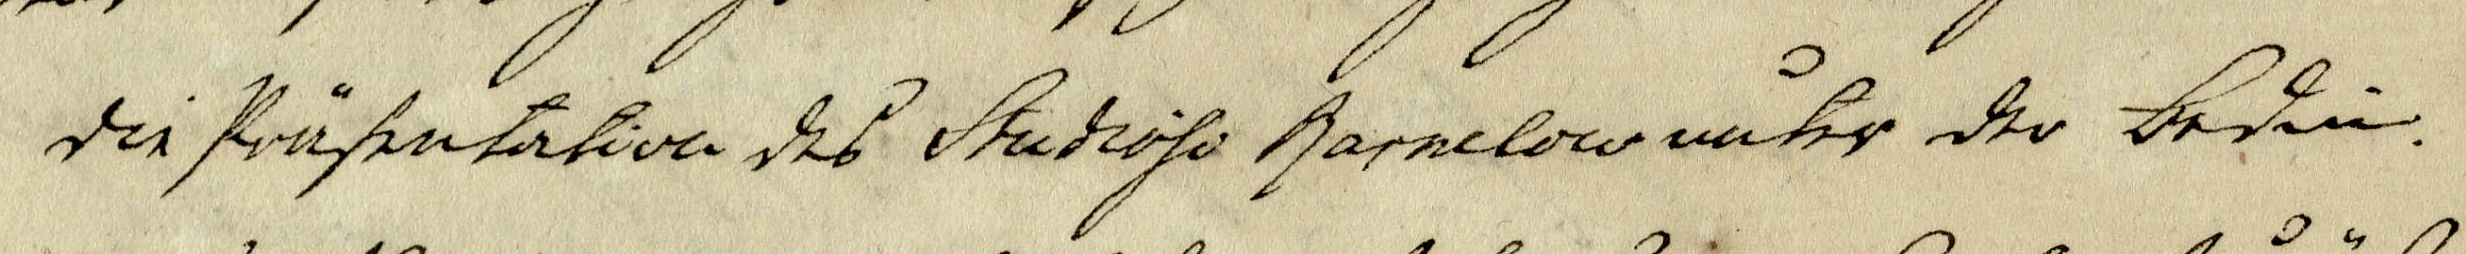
die Präsentation des Studioso Ramelow unter der Bedin¬
